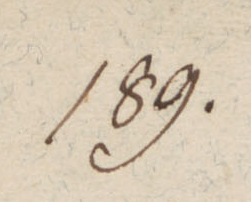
189.
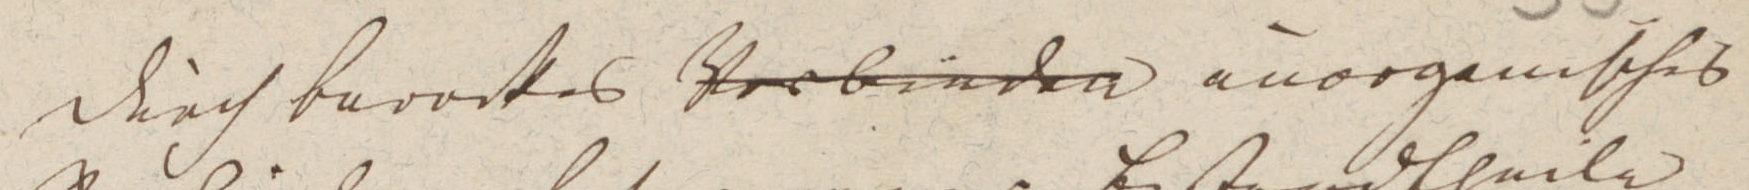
Durch barockes Verbinden unorganisches
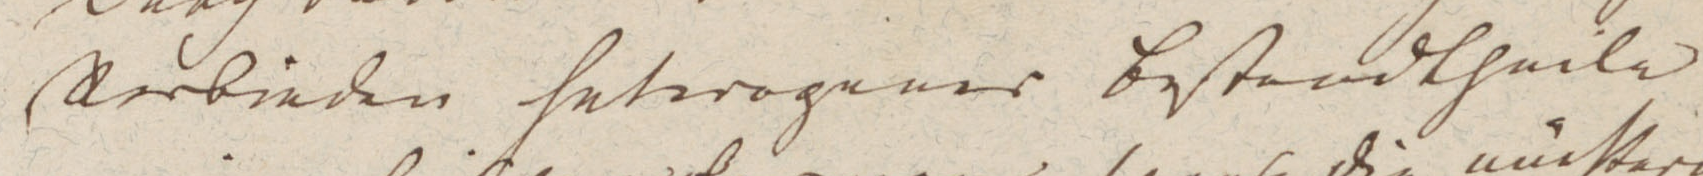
Verbinden heterogener Bestandtheile
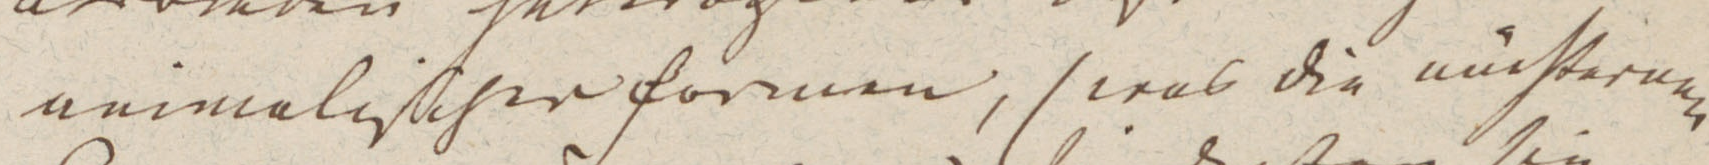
animalischer Formen, (was die nüchternen
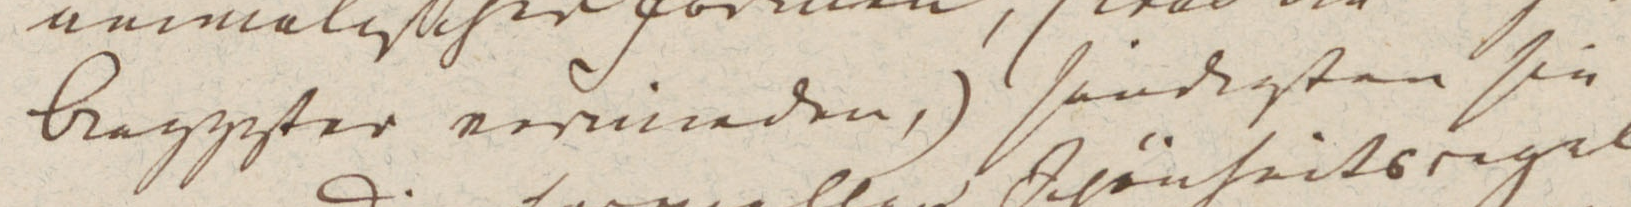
Aegypter vermieden,) sündigten sie
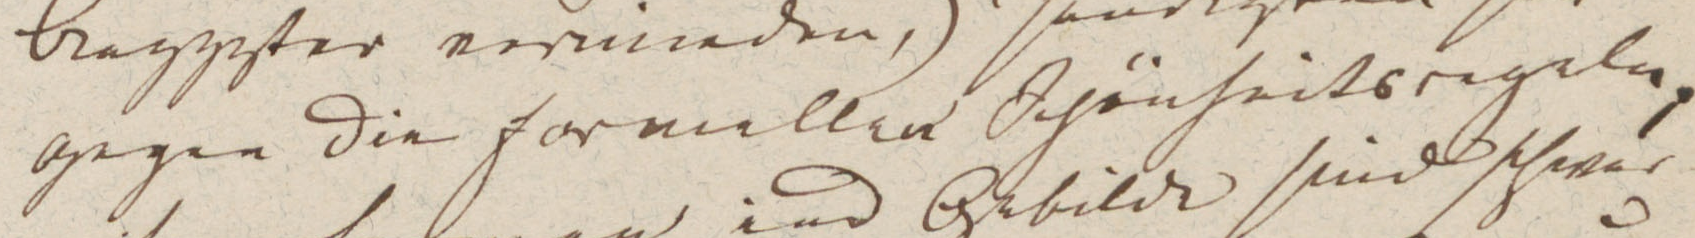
gegen die formellen Schönheitsregeln;
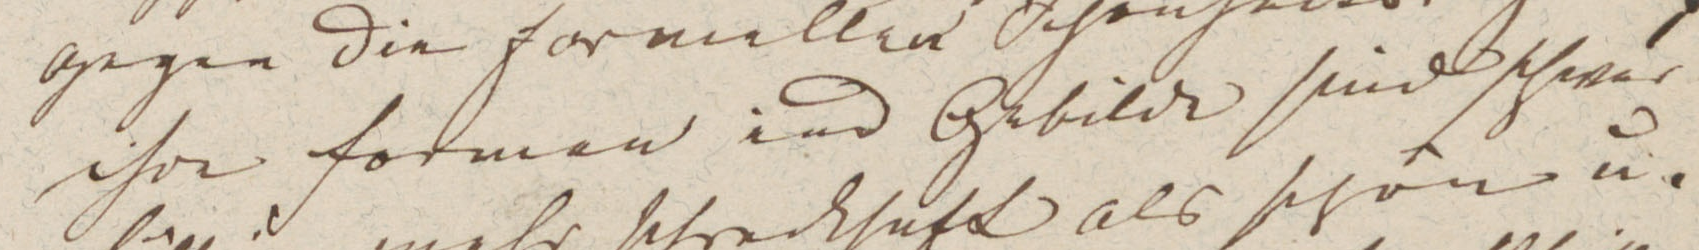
ihre Formen und Gebilde sind schwer-
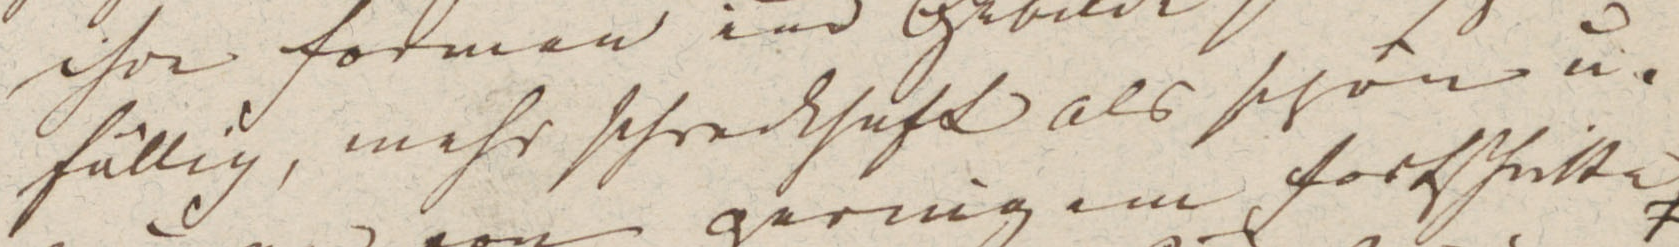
fällig, mehr schreckhaft als schön u.
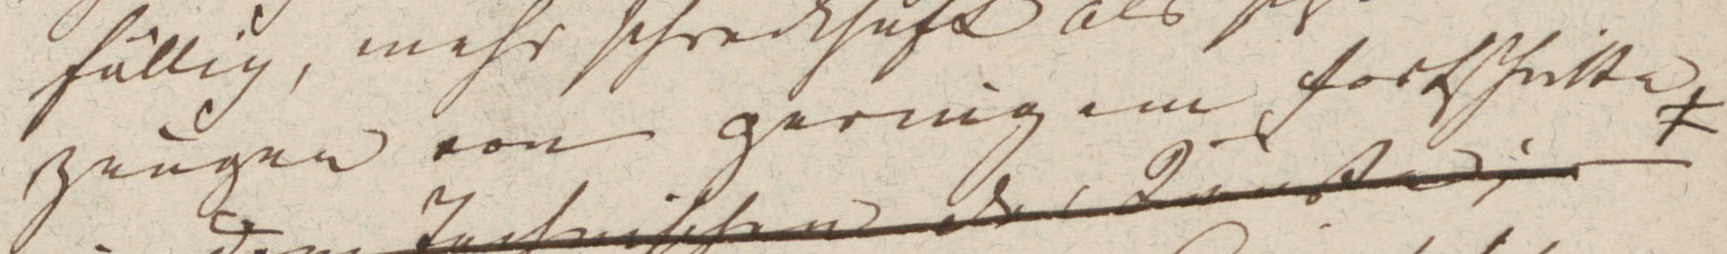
zeugen von geringem Fortschritte
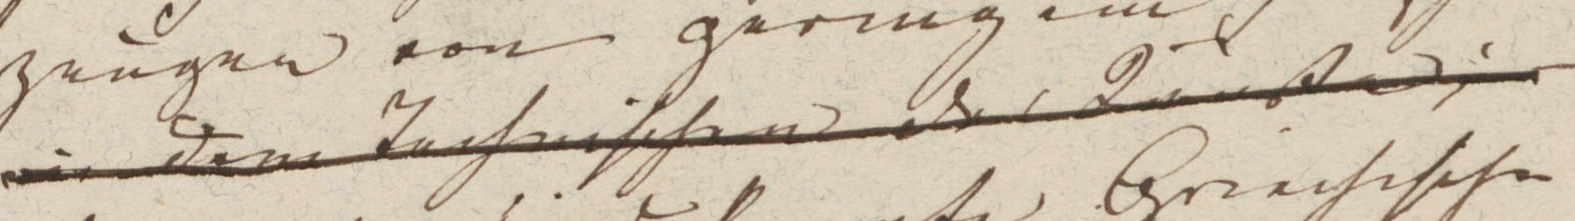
in dem Technischen der Künste; – %
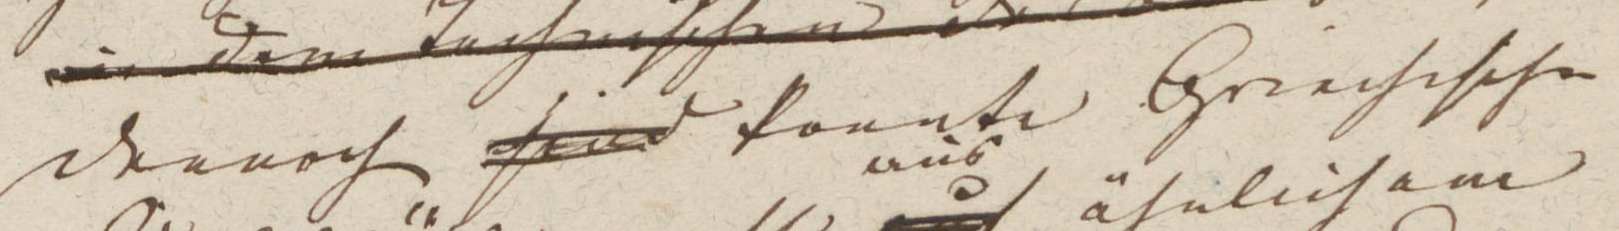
Dennoch sind konnte Griechische
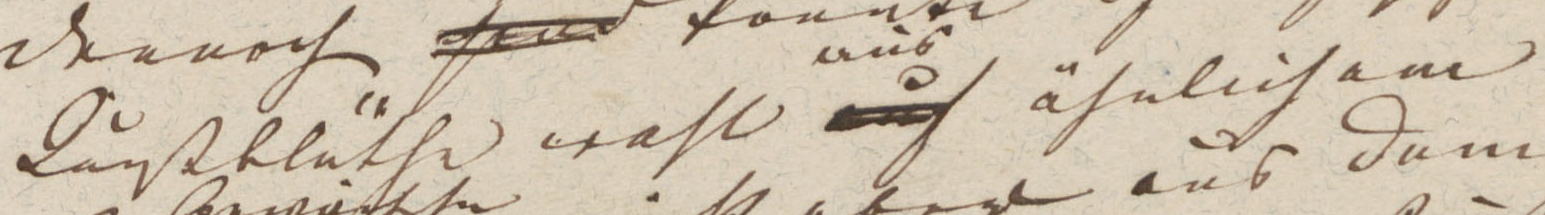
Kunstblüthe wohl auf aus ähnlichem
